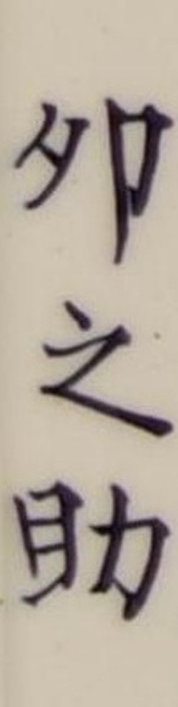卯之助

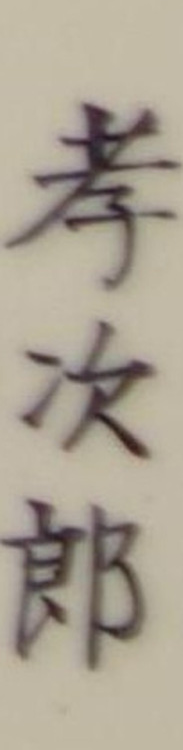孝次郎
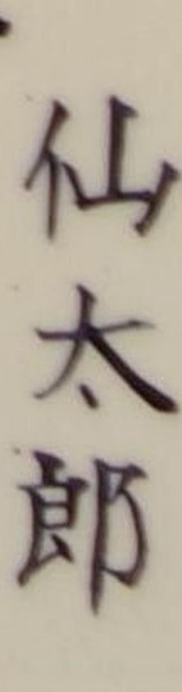仙太郎
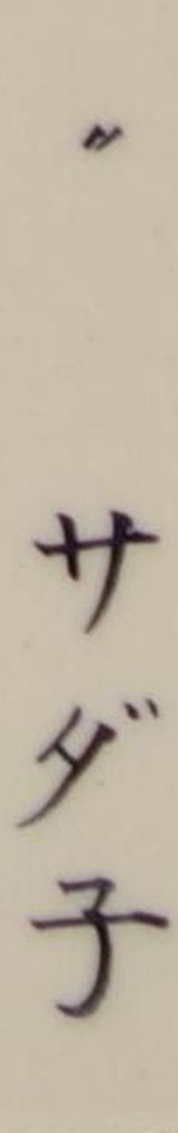サダ子
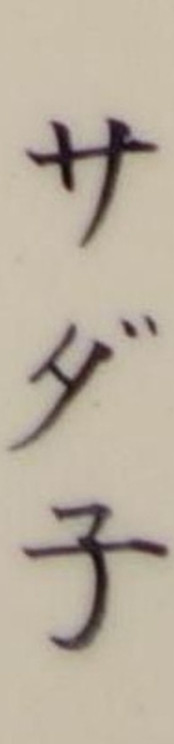サダ子
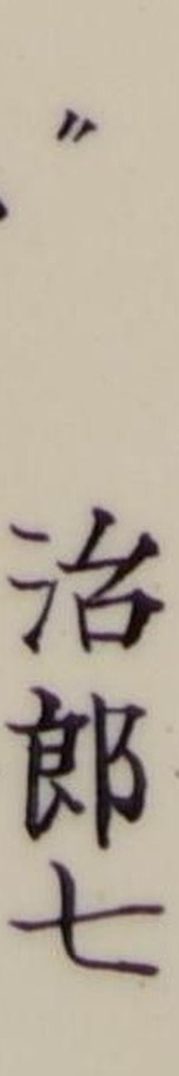治郎七
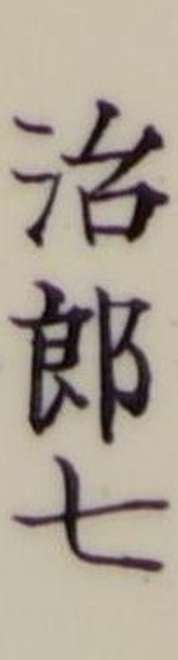治郎七
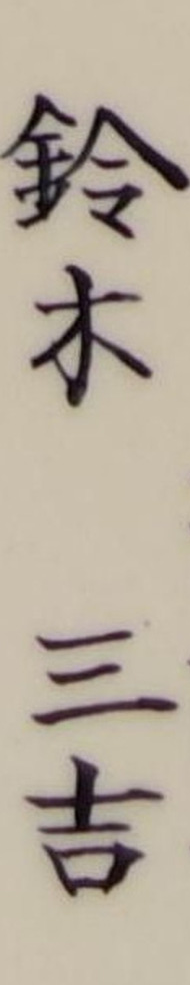鈴木三吉
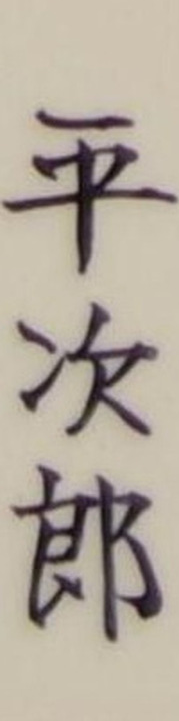平次郎
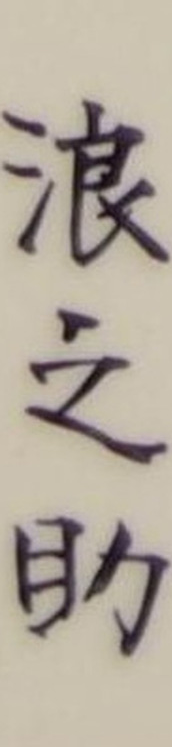浪之助
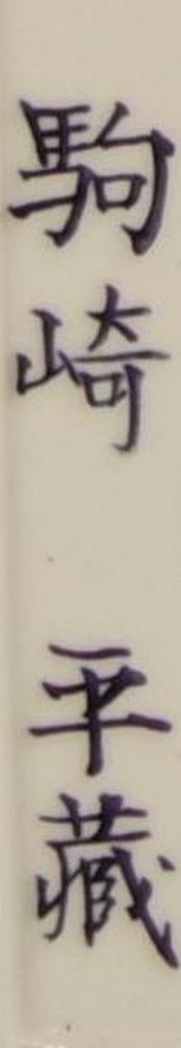駒崎平蔵

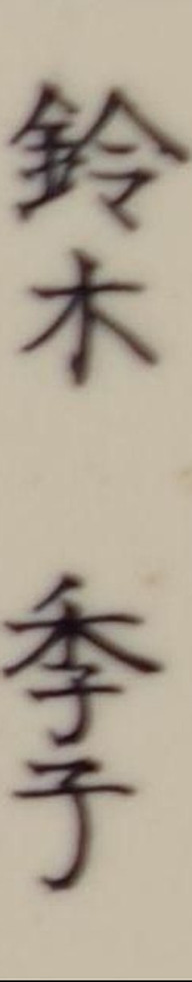鈴木季子
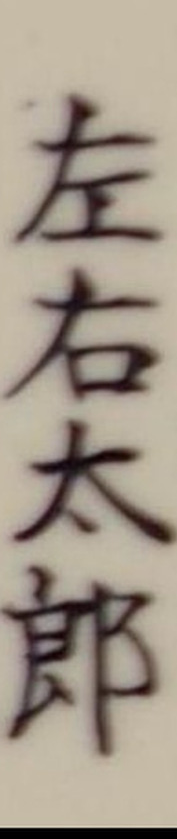左右太郎
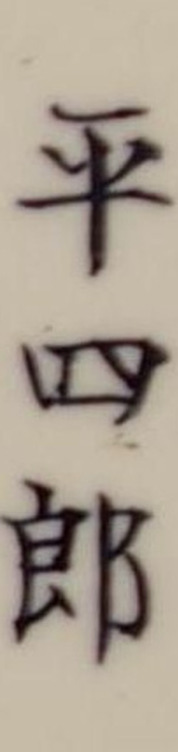平四郎
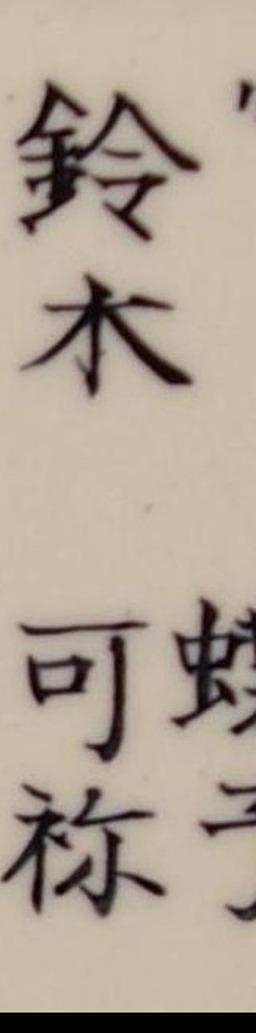鈴木可称
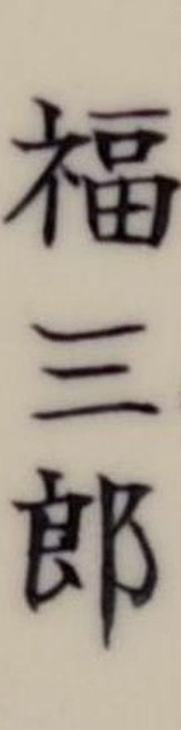福三郎
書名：M~S
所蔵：高野山金剛峯寺
